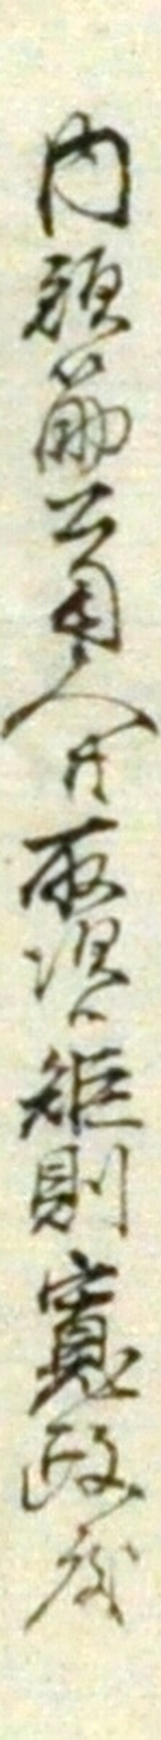内願筋公用人共取次候矩則寛政度
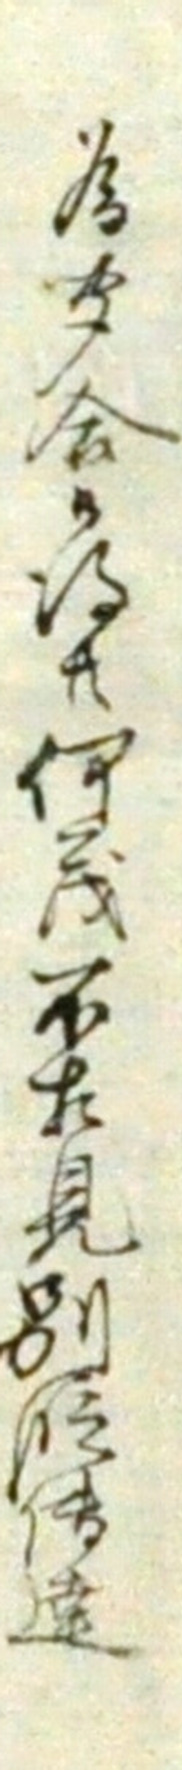為聞合候得共何も不相見別段御達
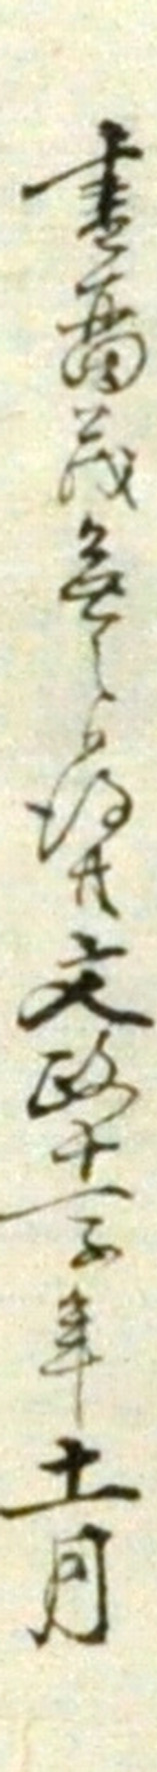書面も無之候得共文政十一子年十一月
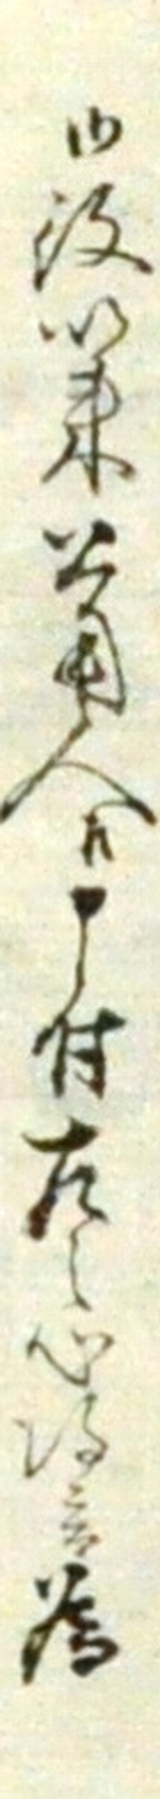御役以来公用人江申付左之心得ニ而為
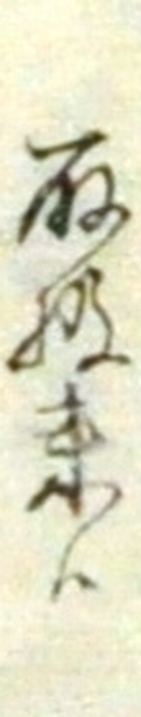取扱来候
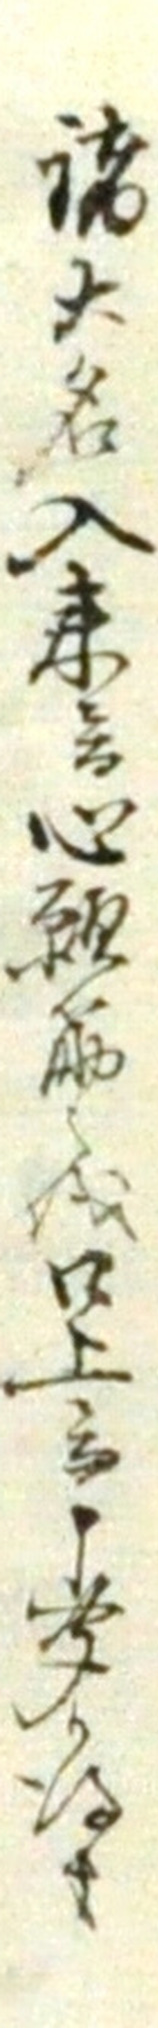諸大名入来ニ而心願筋之儀口上ニ而申聞候得者
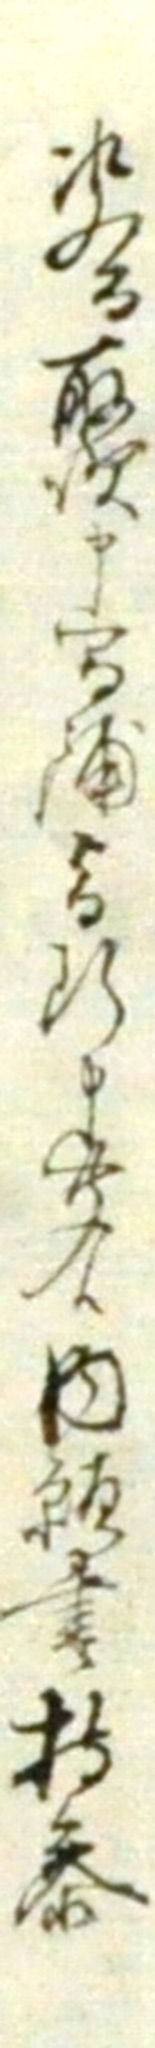決而取次申間敷旨断申聞候内願書持参
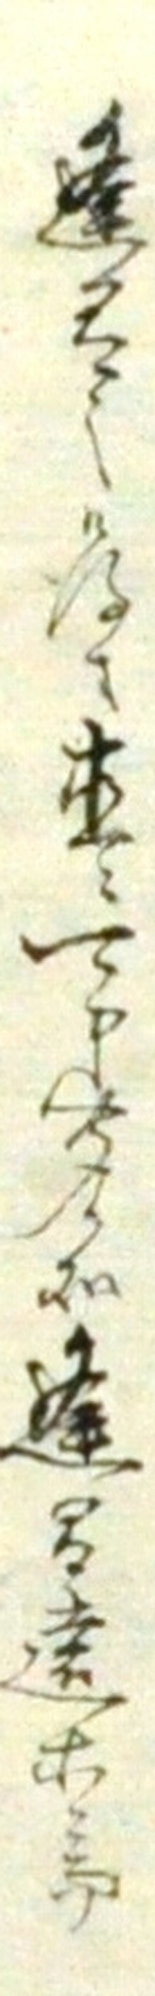逢有之候得者直ニ可申聞候処逢間違等ニ而
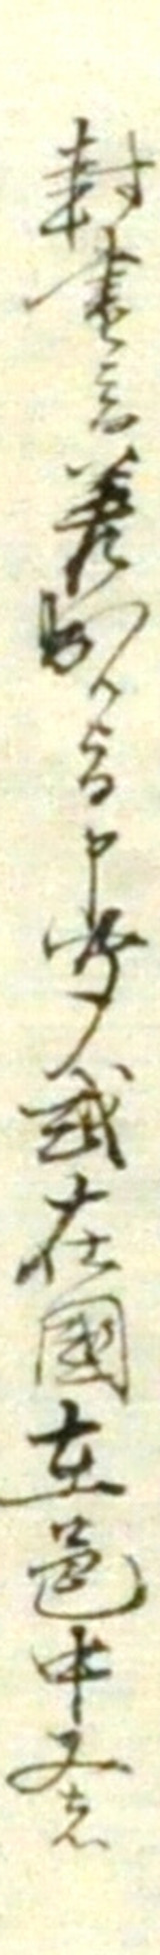封書ニ而差出候旨申聞或在国在邑中又者
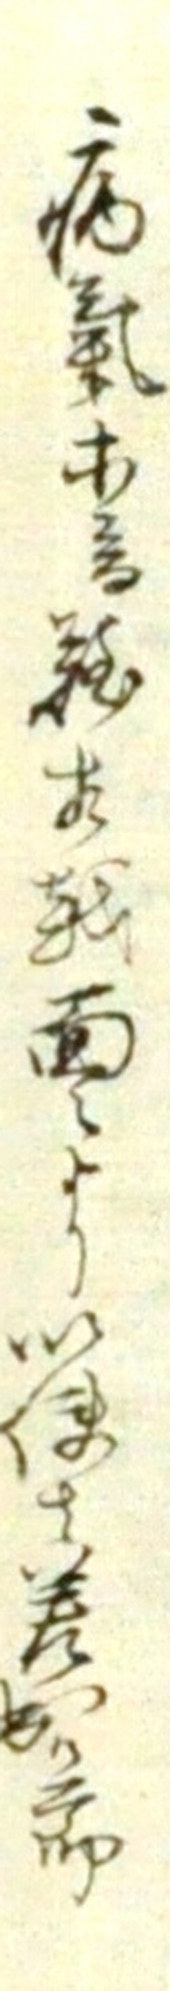病気等ニ而難相越面々より以使者差出候節
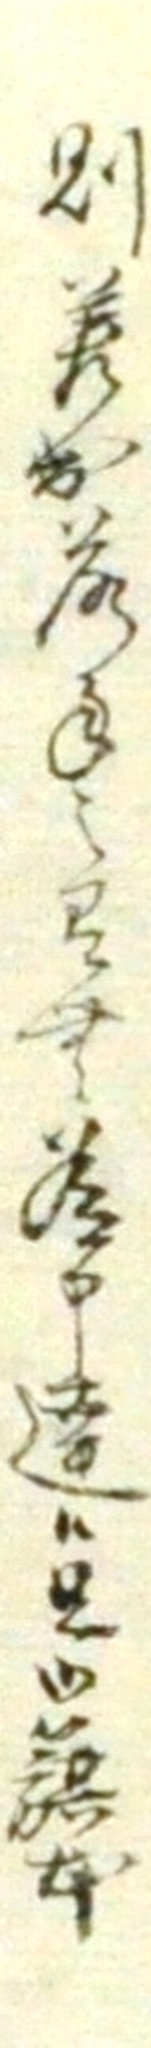則差出落手之有無為申達候且御旗本
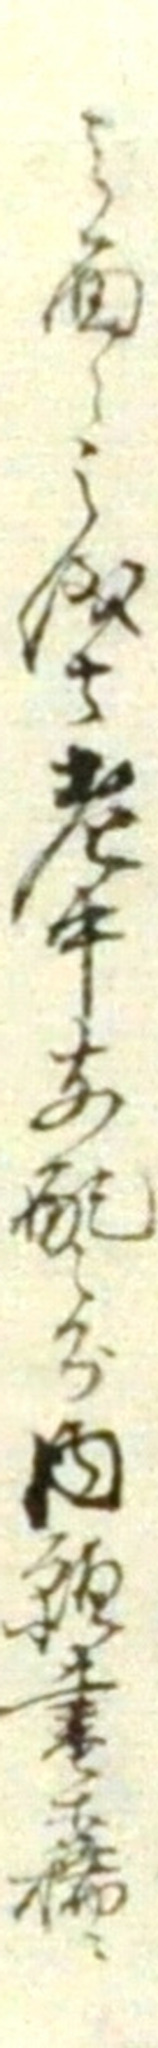之面々之儀者老中支配之分内願書等稀ニ
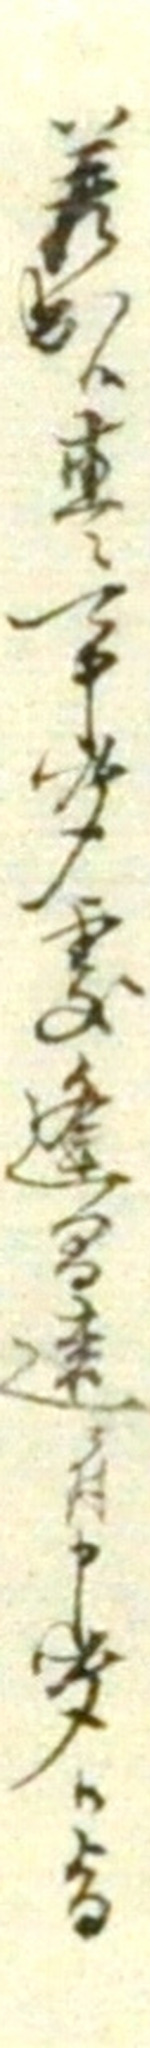差出候直ニ可申聞処逢間違ニ付申聞候旨
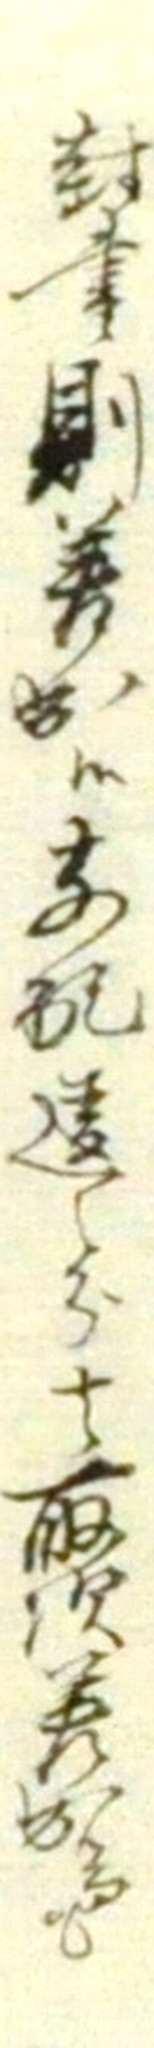封書則差出候支配違之分者取次差出候而も
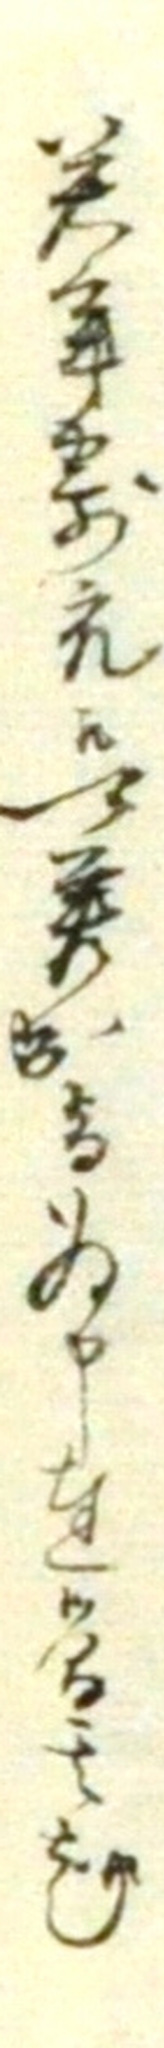若年寄元江可差出旨為申達候間其趣
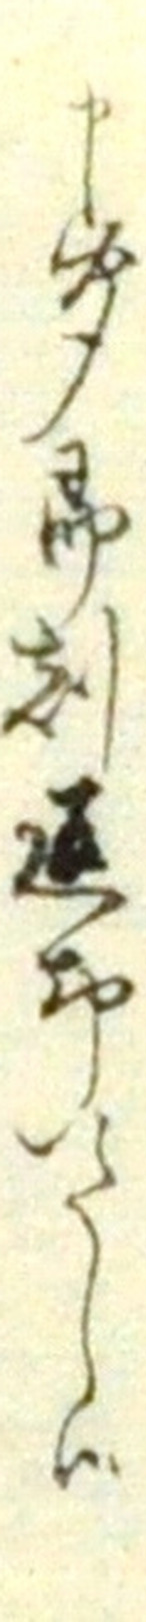申聞即刻返却いたし候
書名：越前殿被為見候書付写
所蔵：伊那市立高遠町図書館・合同会社AMANE
